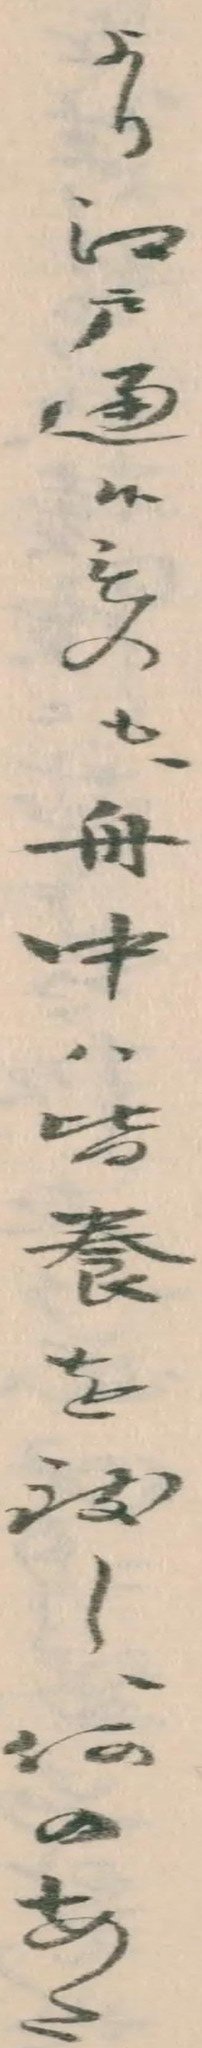より江戸通候ものも、舟中は皆養を致し、何のあた
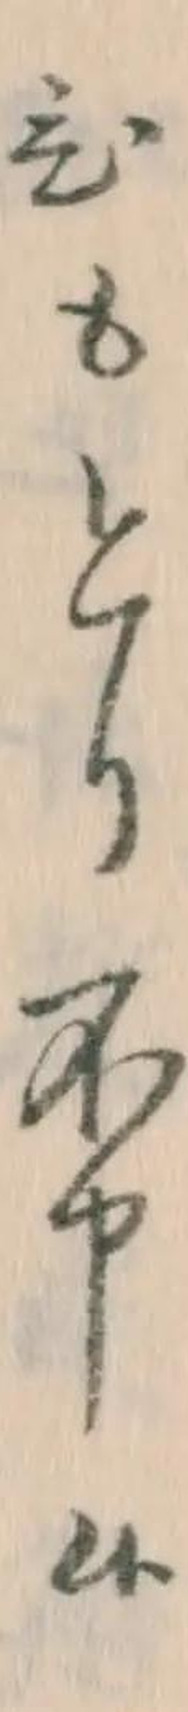ひもとり不申候
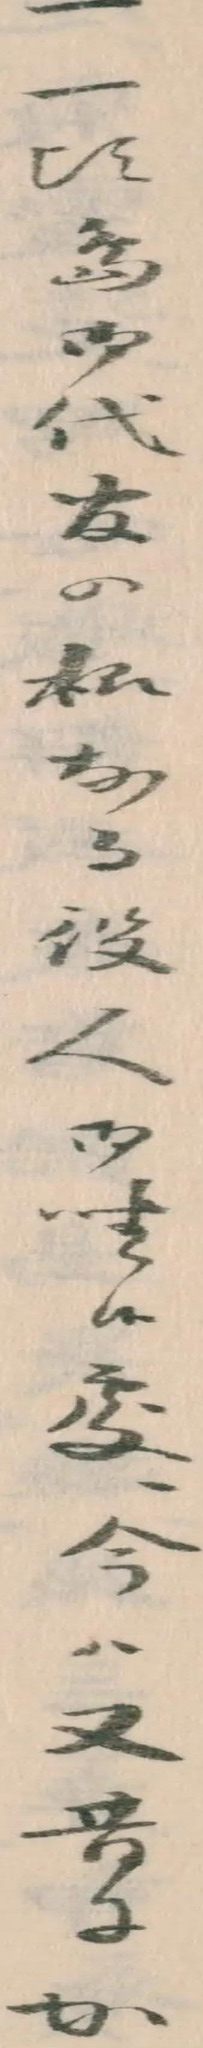一一頃島御代官の様なる役人御坐候処、今は又昔にか
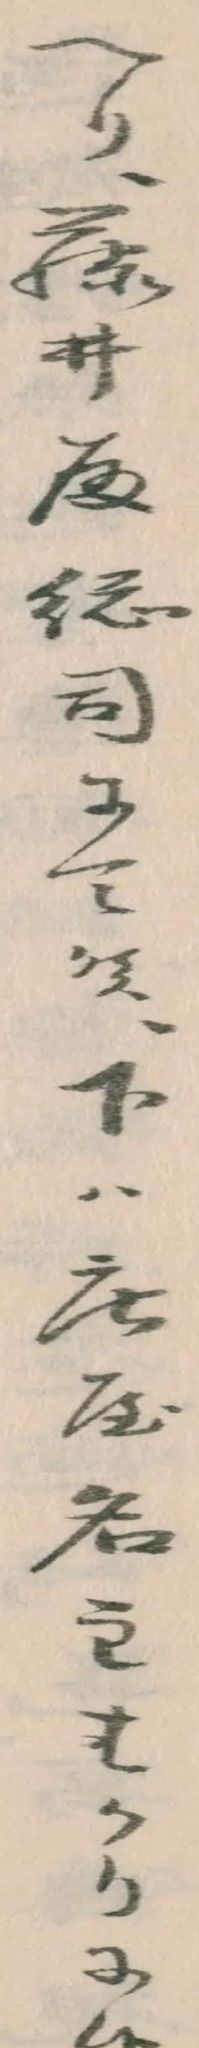へり、藤井殿総司にて候、下は庄屋名主はかりに候
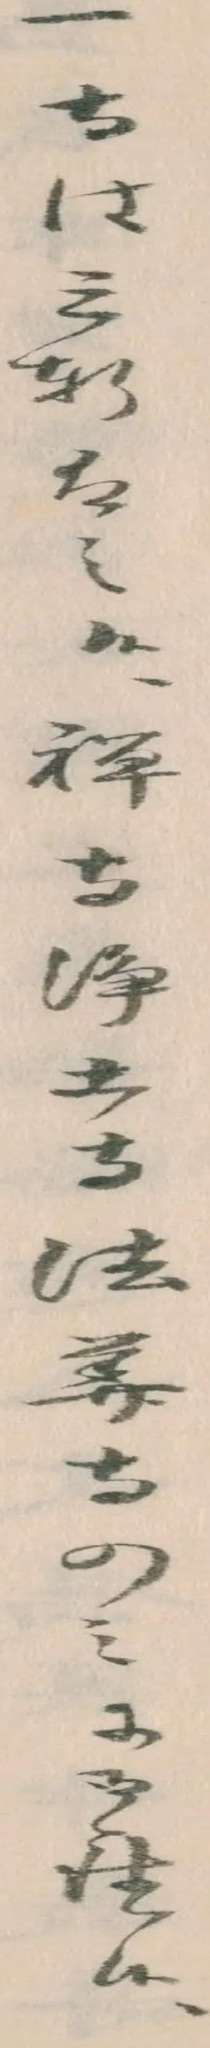一寺は三軒有之候、禅寺浄土寺法算寺のみに御座候、
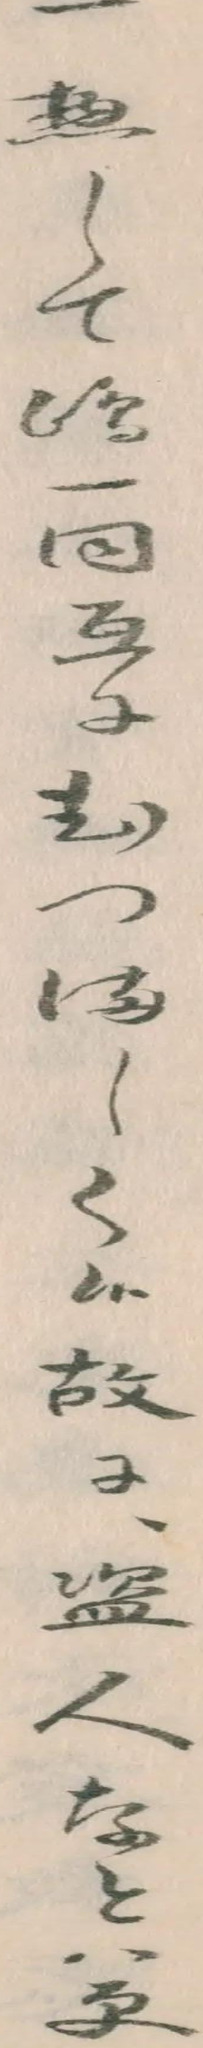一惣して嶋一同互にむつましく候故に、盗人なとは更
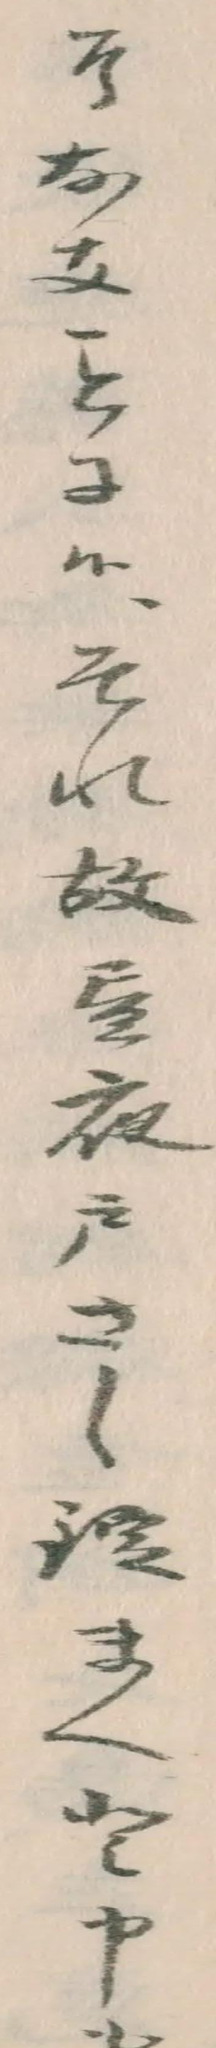になきことに候、それ故昼夜戸さし錠まへと申も
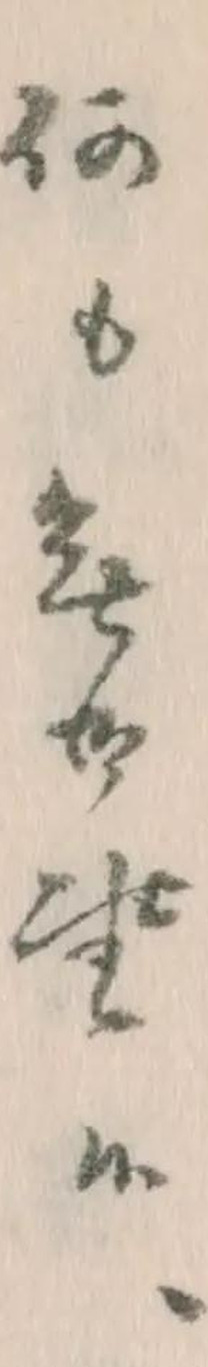何も無御坐候、
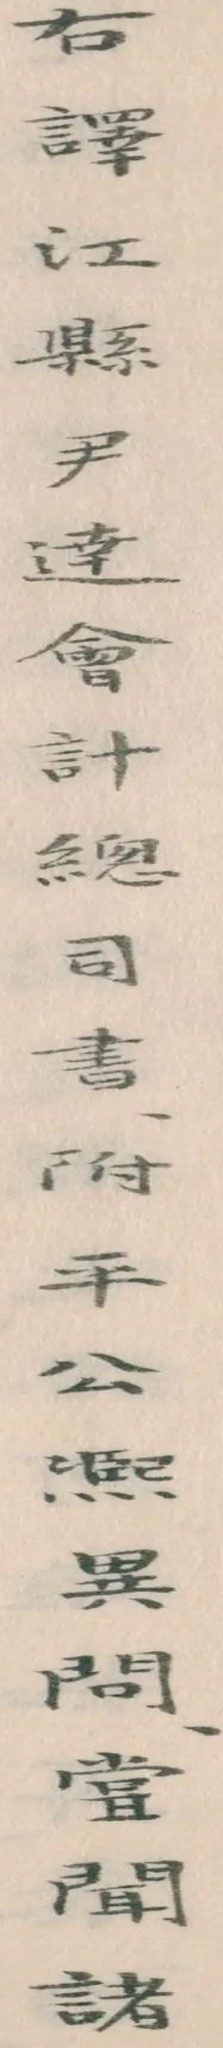右譯江県尹達会計総司書、附平公凞異問、甞聞諸
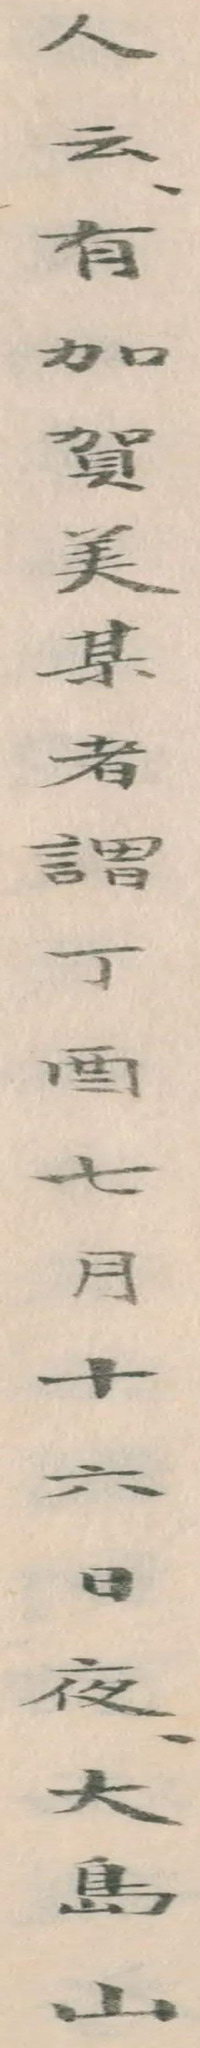人云、有加賀美某者謂丁酉七月十六日夜、大島山
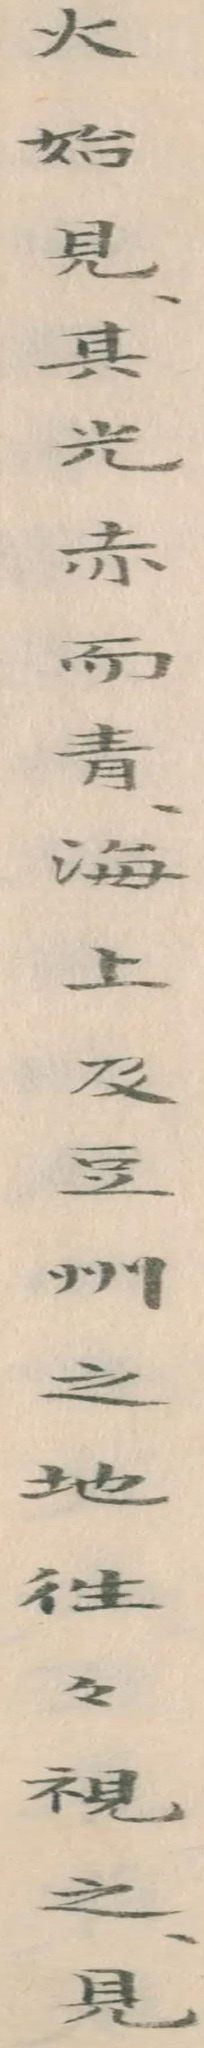火始見、其光赤而青、海上及豆州之地往々視之、見

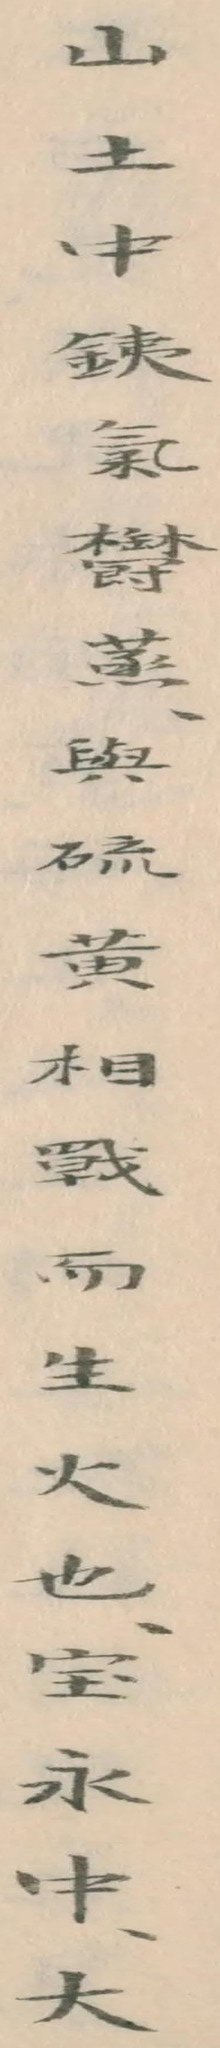山土中鉄気鬱蒸、與硫黄相戦而生火也、宝永中、大
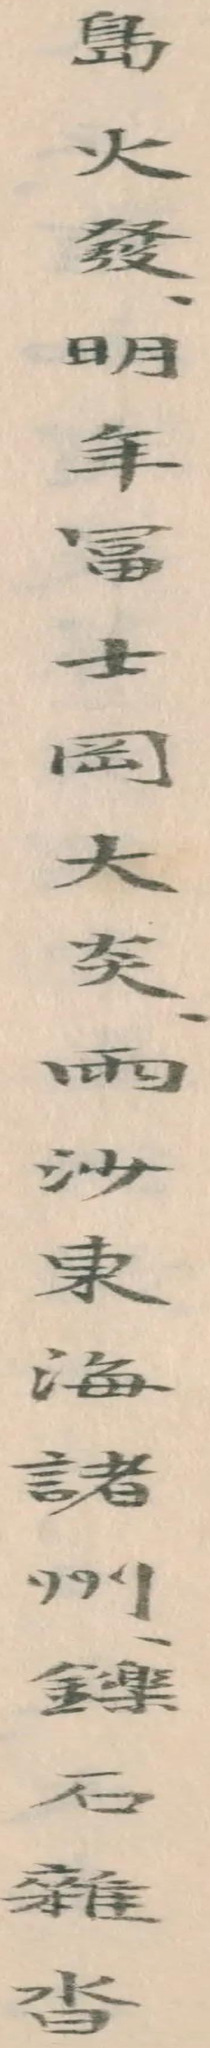島火発、明年富士岡大炎、両沙東海諸州、鑠石雑沓
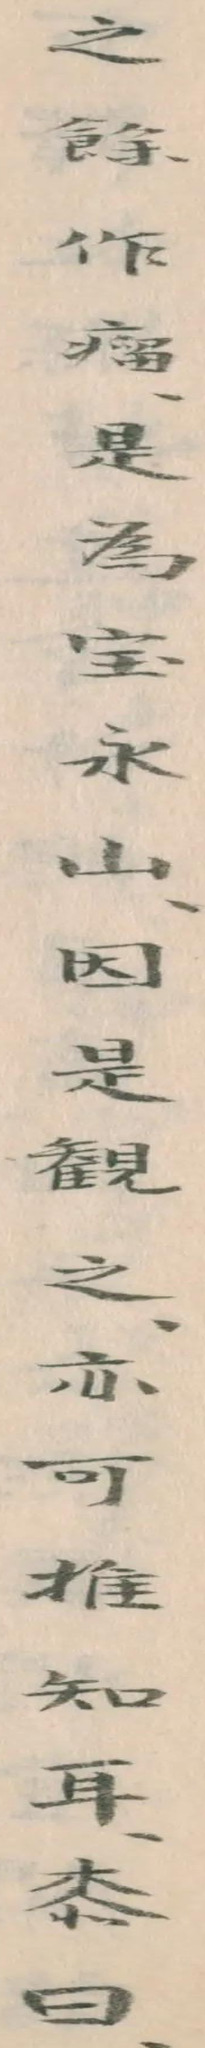之余作瘤、是為宝永山、因是観之、亦可推知耳、忝曰、
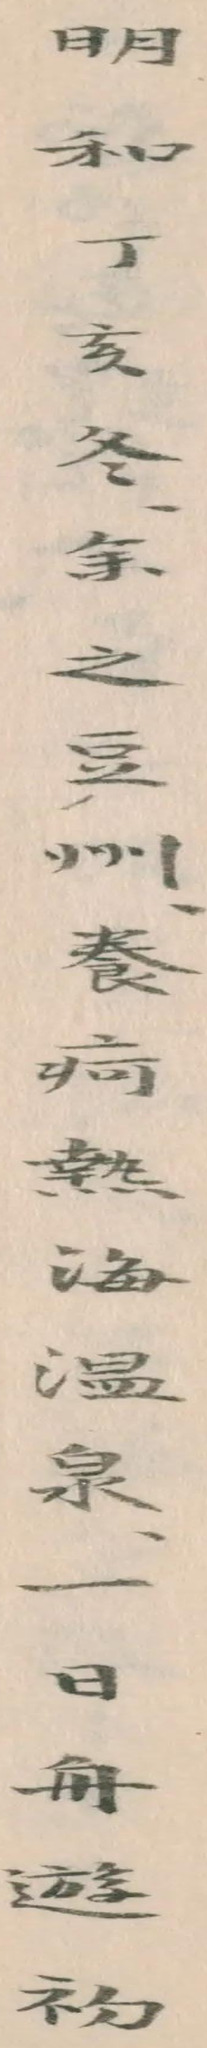明和丁亥冬、余之豆州、養疴熱海温泉、一日舟遊初
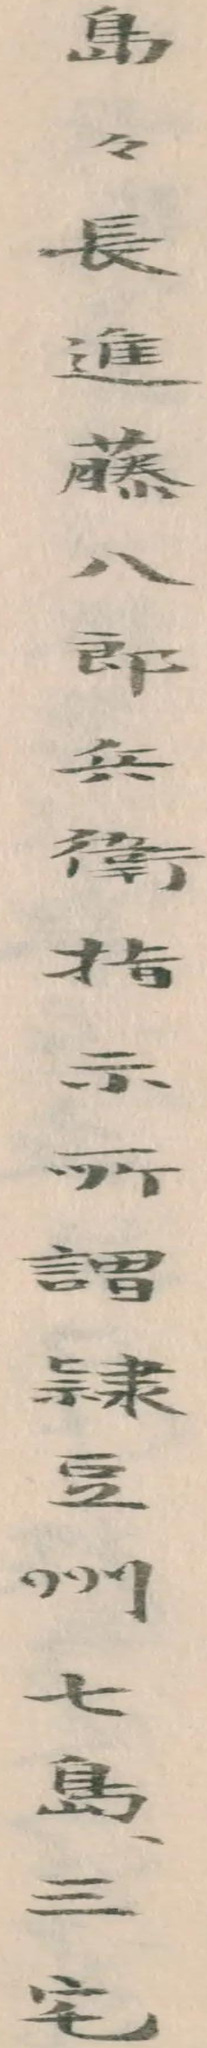島々長進藤八郎兵衛指示所謂隷豆州七島、三宅
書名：地災撮要. 巻11-12(地震之部)
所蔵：国立国会図書館 National Diet Library, JAPAN
